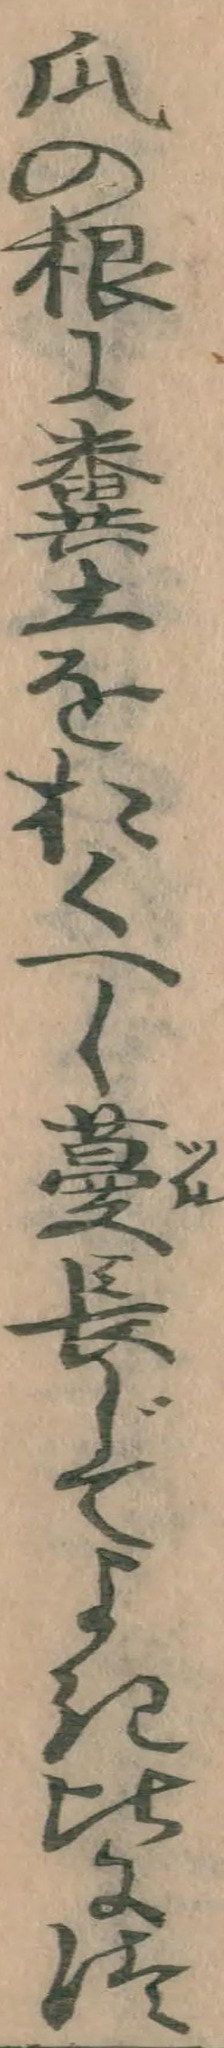瓜の根に糞土をおくへし蔓長じてよき比につ
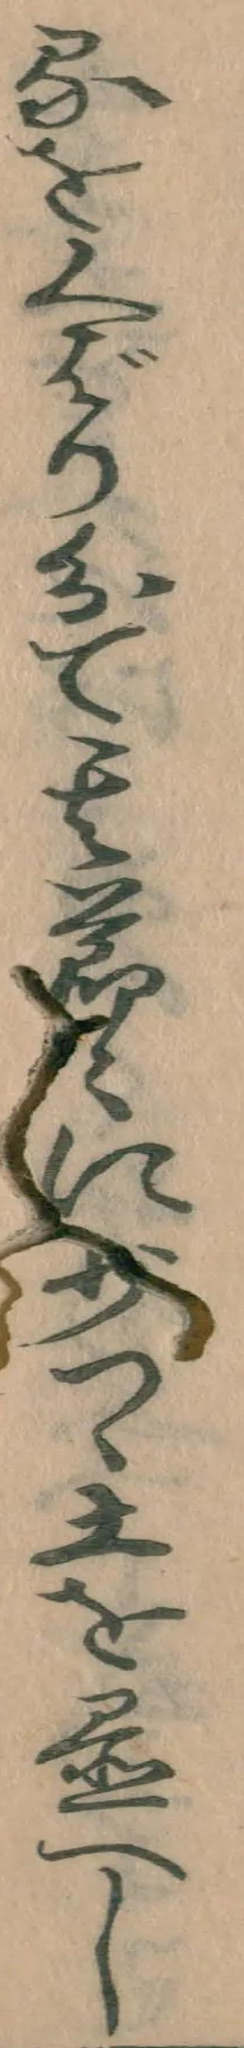るをくばり分て其節々に少つゝ土を置へし
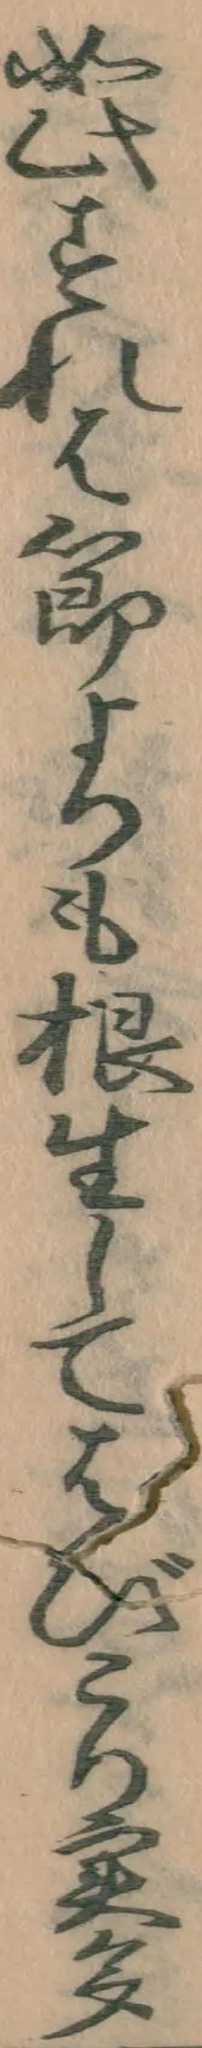如此すれは節よりも根生してはびこり実多
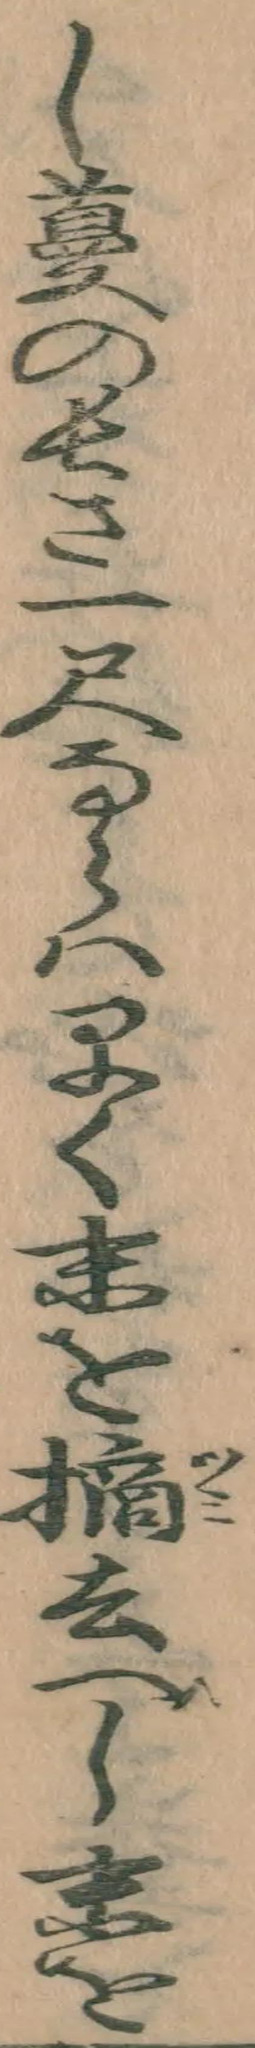し蔓の長さ一尺ならは早く末を摘去へし末を
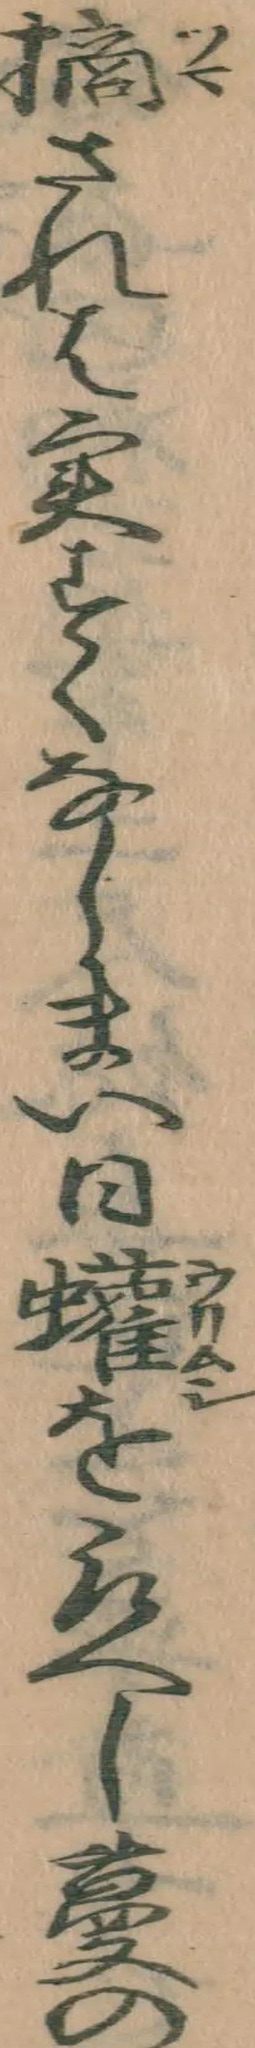摘されは実すくなしまい日蠸を取へし蔓の
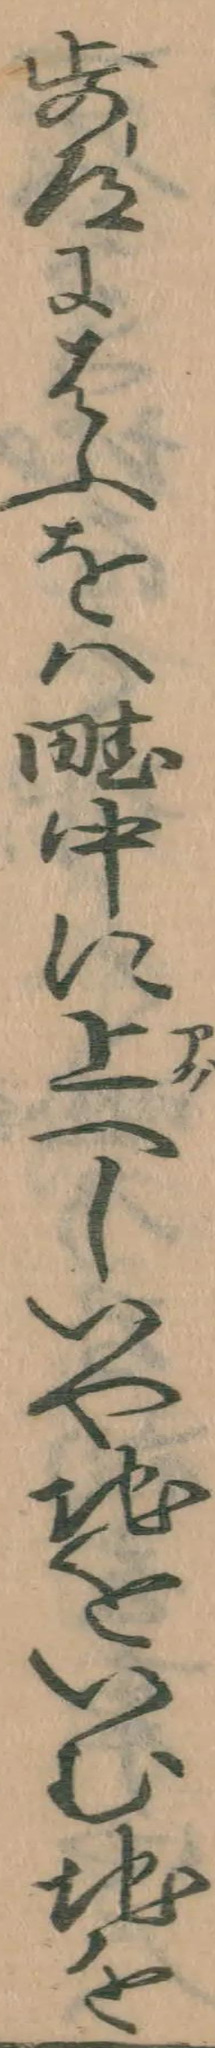歩-道にはふをは畦中に上へしいや地をいむ地を
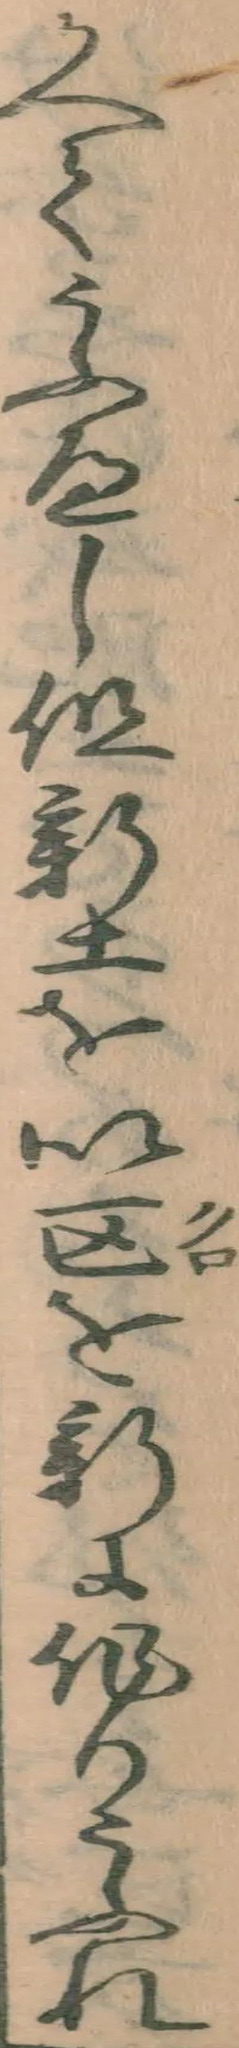かへてうふへし但新土を以区新に作りうふれ
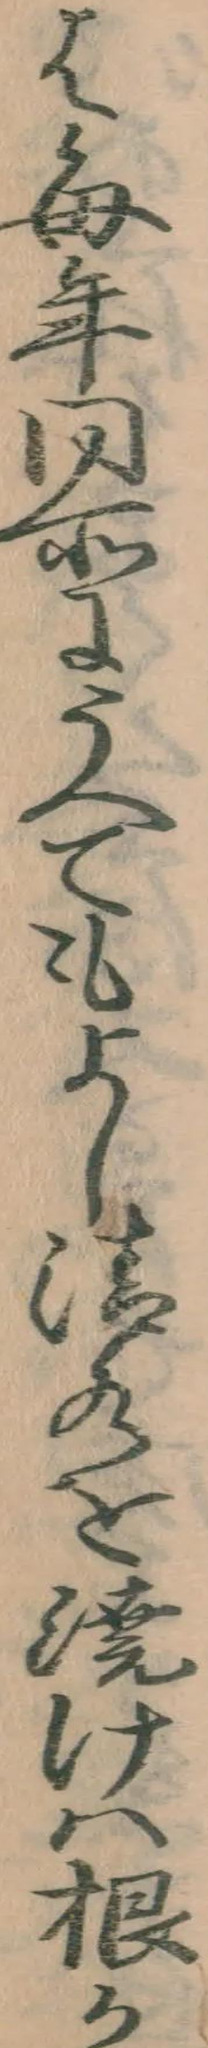は毎年同所にうへてもよし清水を澆けは根か
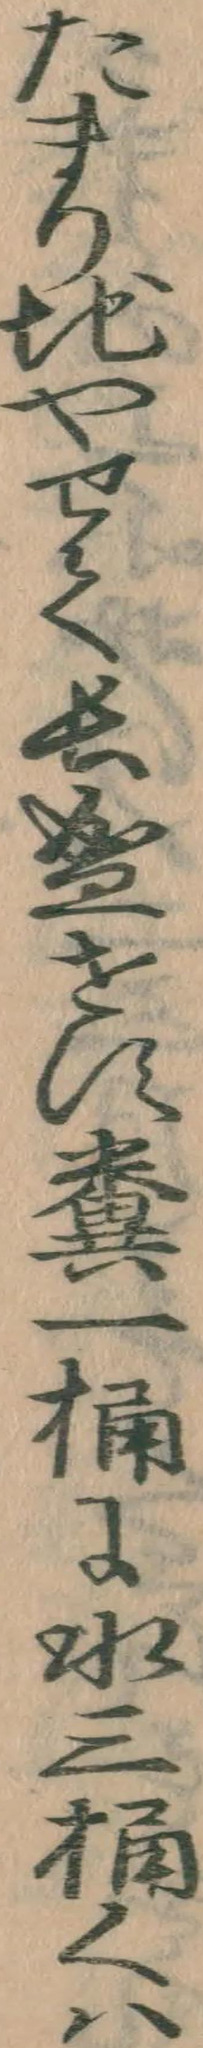たまり地やせて長盛せす糞一桶に水三桶くは
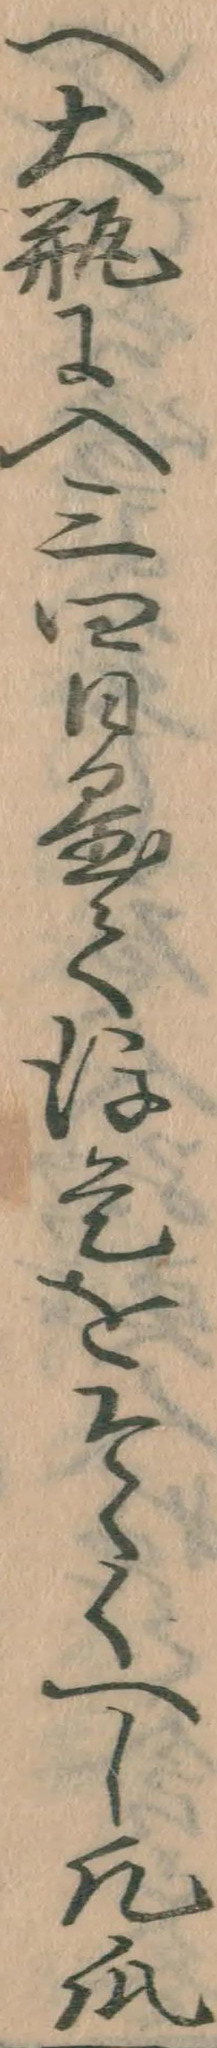へ大瓶に入三四日置く後是をそゝくへし凡瓜
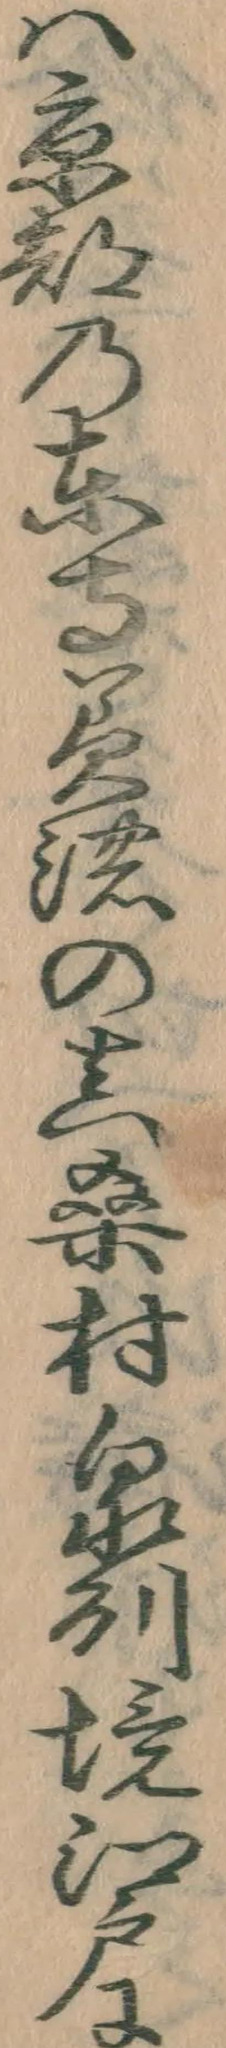は京都の東寺美濃の真桑村泉州境江戸に
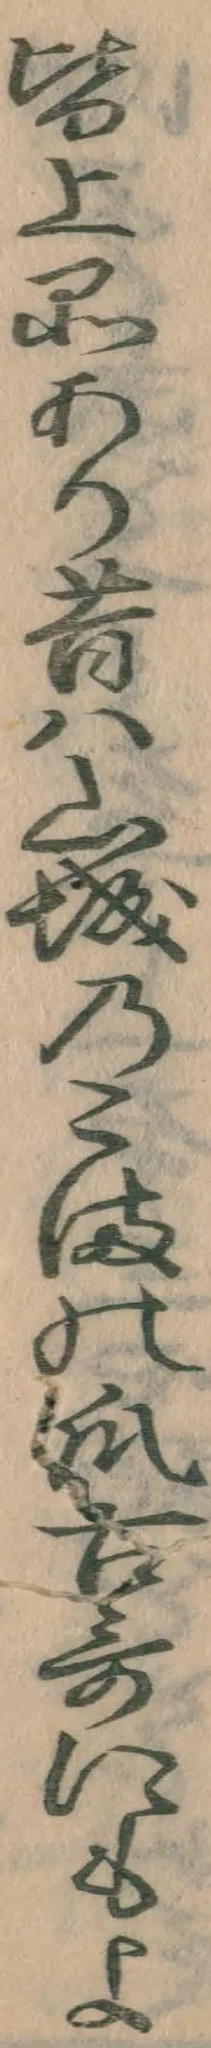皆上品あり昔は山城のこまの瓜古哥にもよ
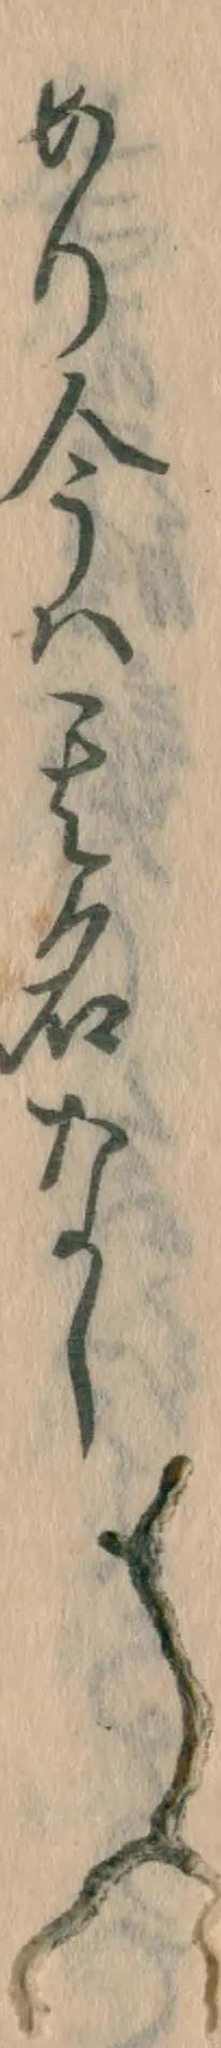めり今は其名なし
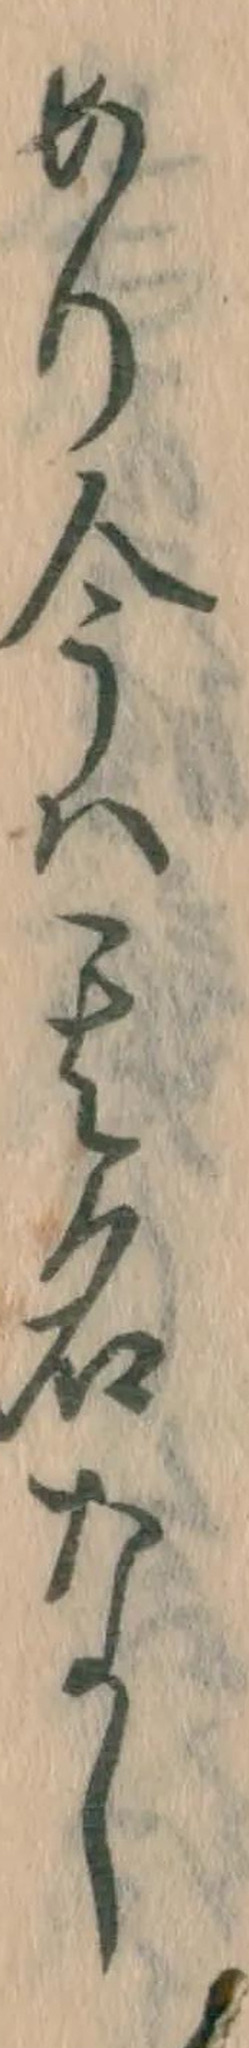めり今は其名なし
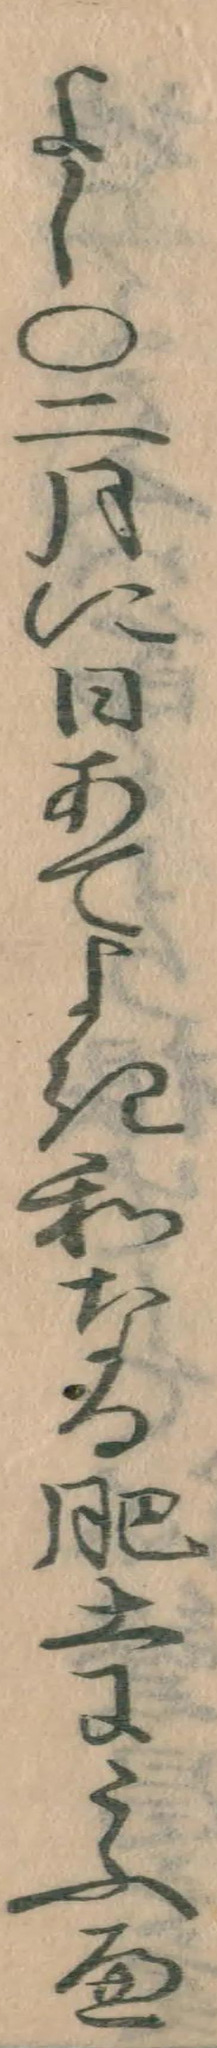よし〇二月に日にあてよき和なる肥土にうふへ
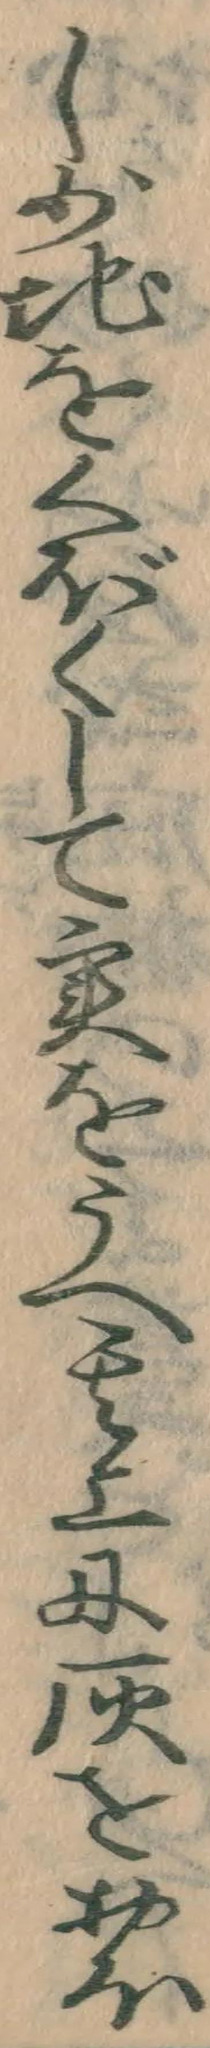し少地をくぼくして実をうへ其上に灰をおほ
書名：菜譜 3巻
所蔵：国立国会図書館 National Diet Library, JAPAN
